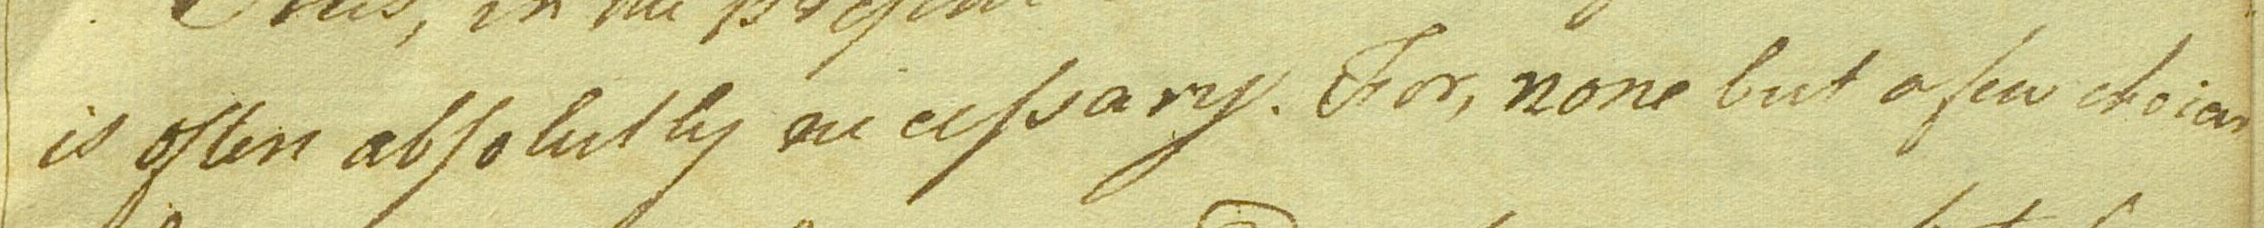is often absolutely necessary. For, none but a few choice
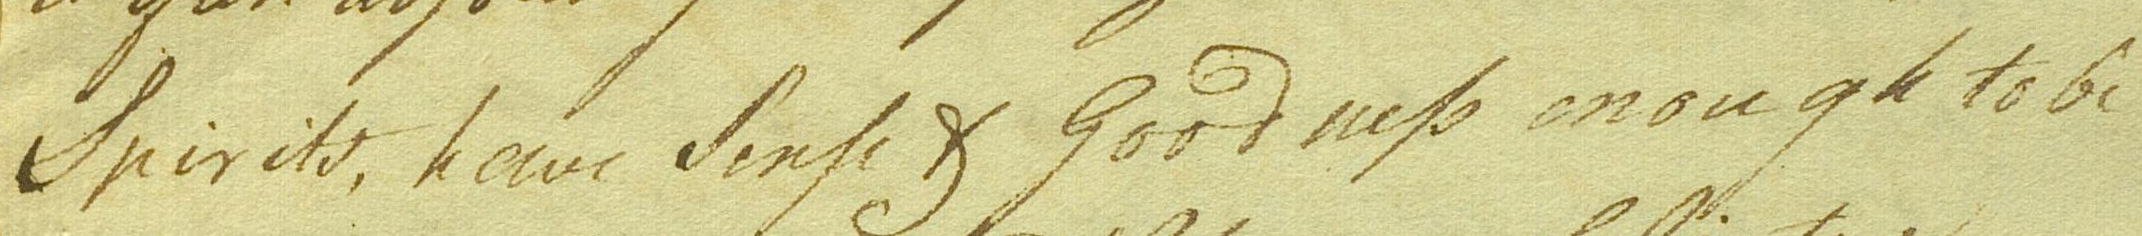Spirits, have Sense & Goodness enough to be
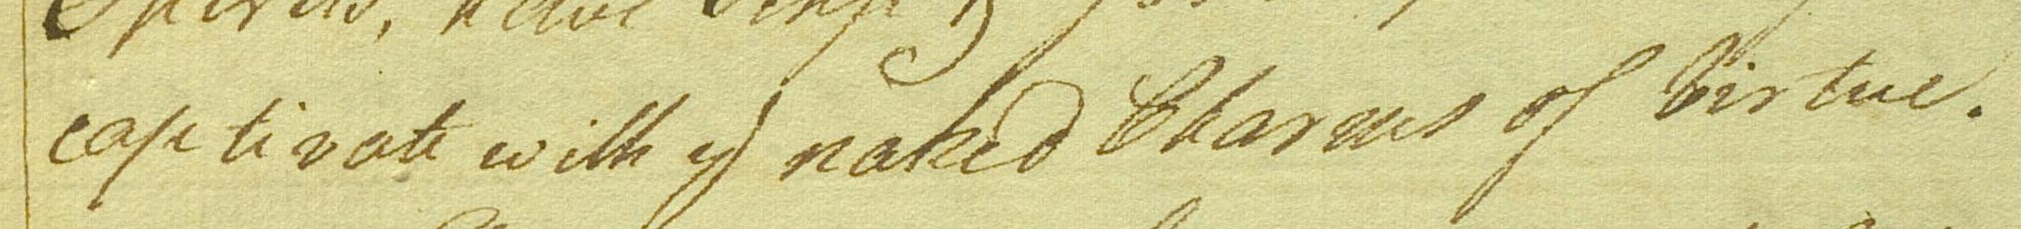captivate with y^e naked Charms of Virtues.
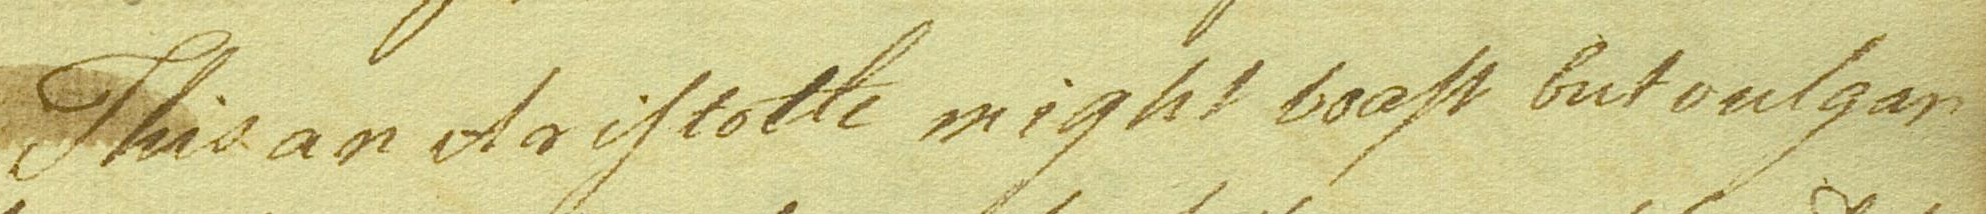This an Aristotle might boast but vulgar
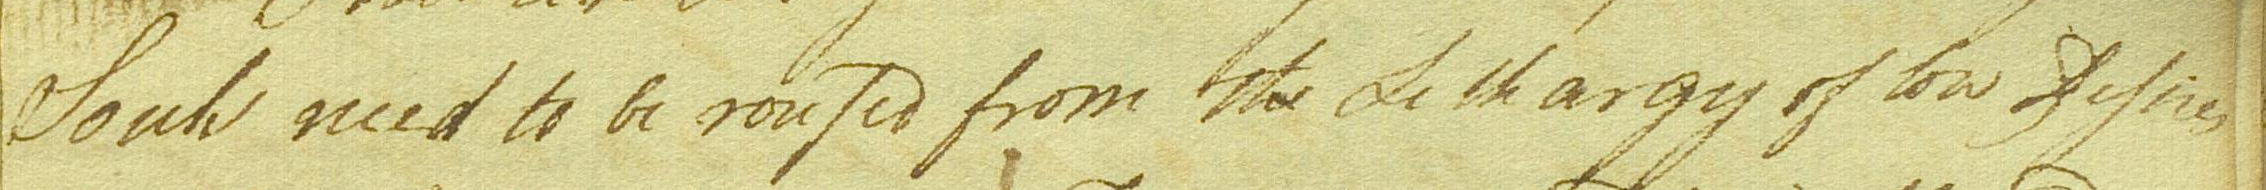Souls need to be roused from the Lethargy of low Desires
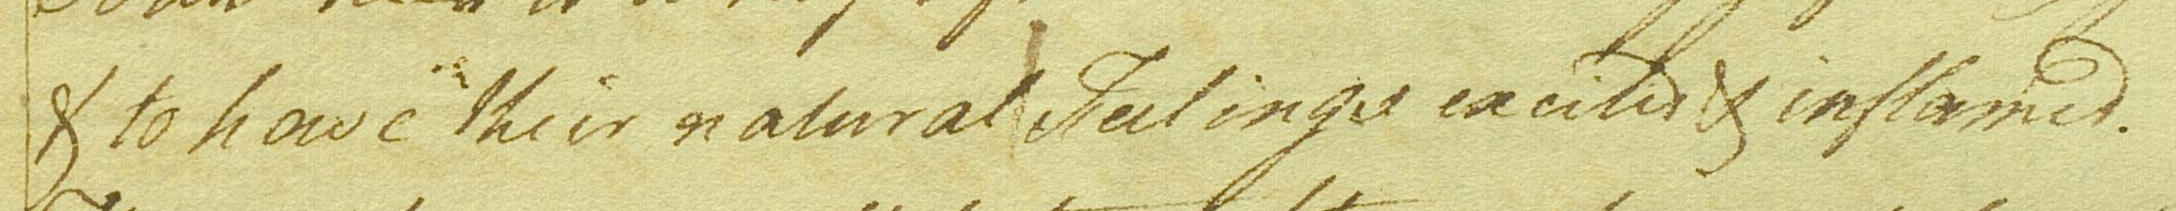& to have their natural Feelings excited & inflamed.
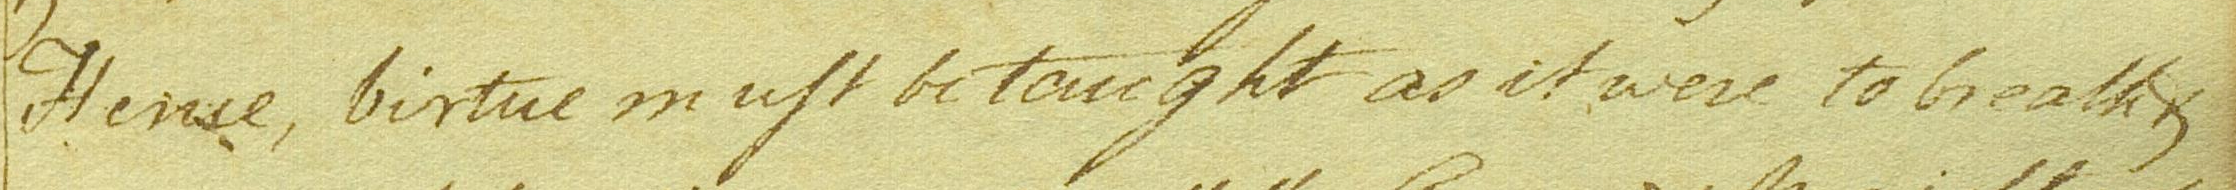Hence, virtue must be taught as it were to breath &
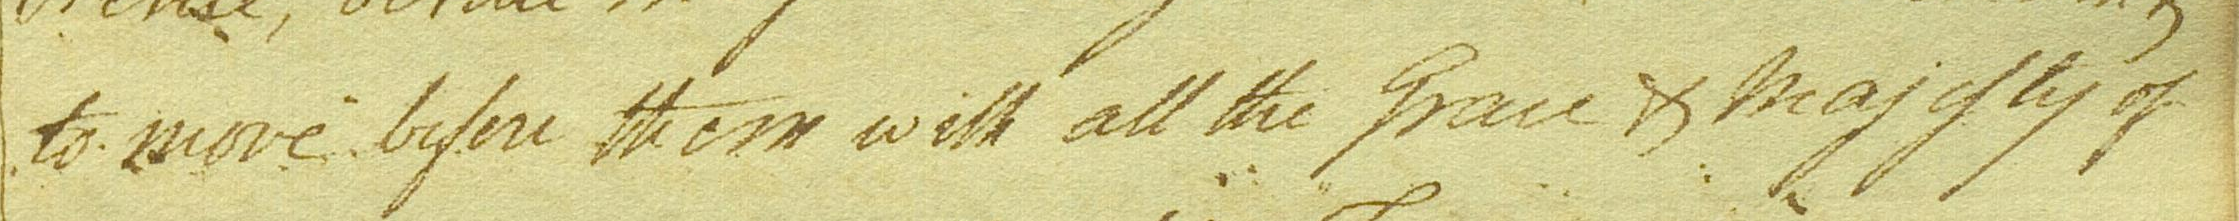to move before them with all the Grace & Majesty of
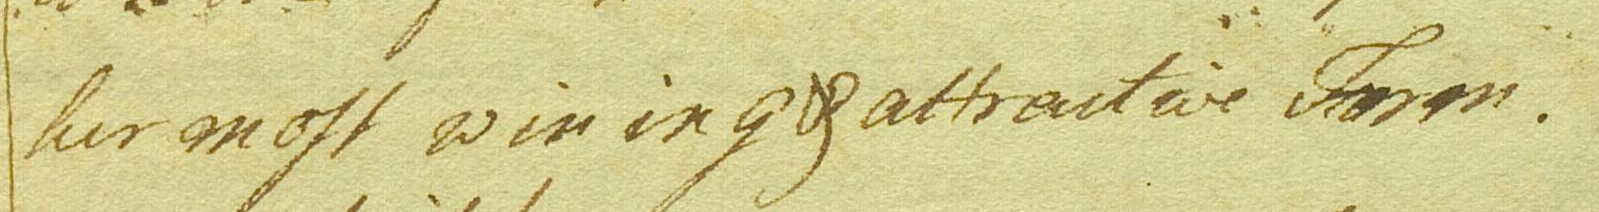her most winning & attractive Form.
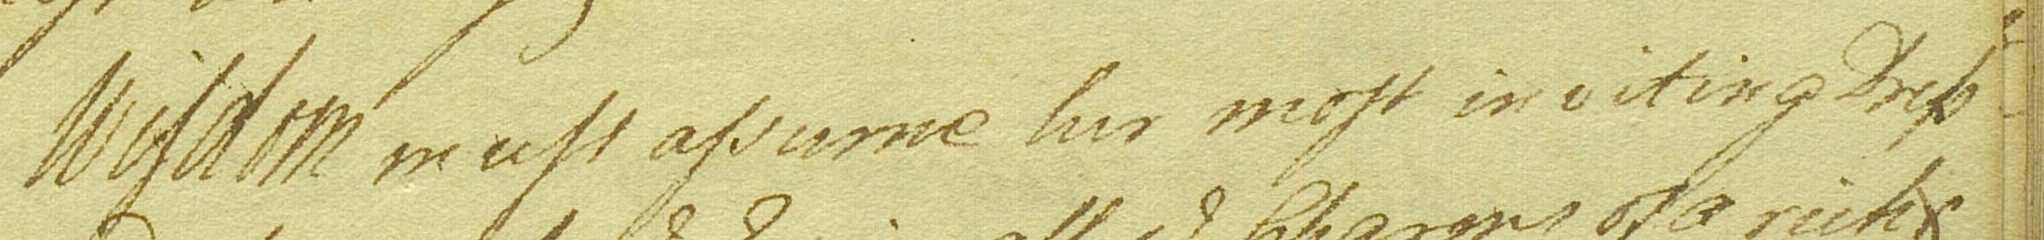Wisdom must assume her most inviting Dress
